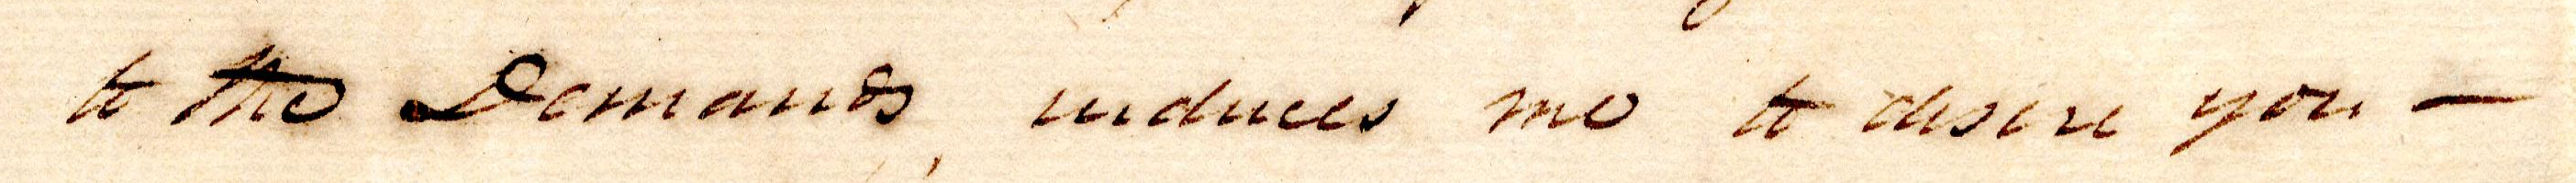to the Demands induces me to desire you
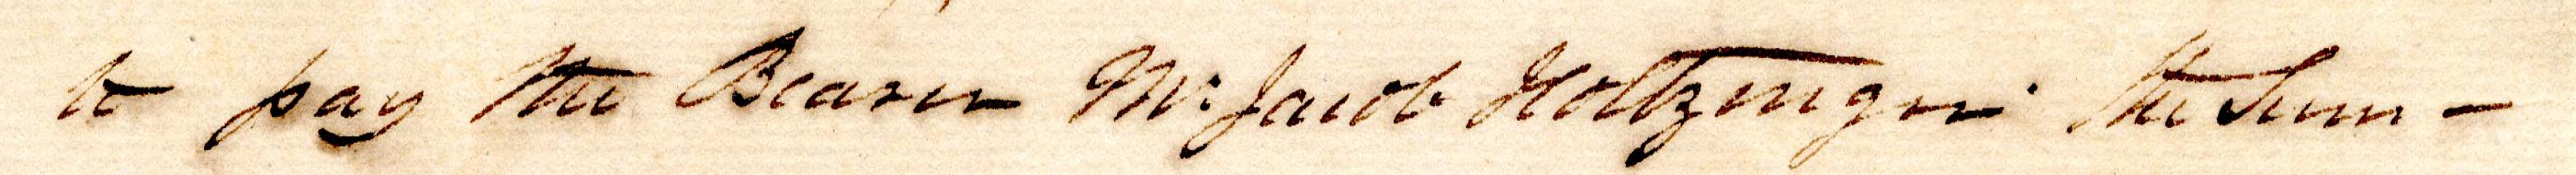to pay the Bearer M^r: Jacob Holzinger the Sum
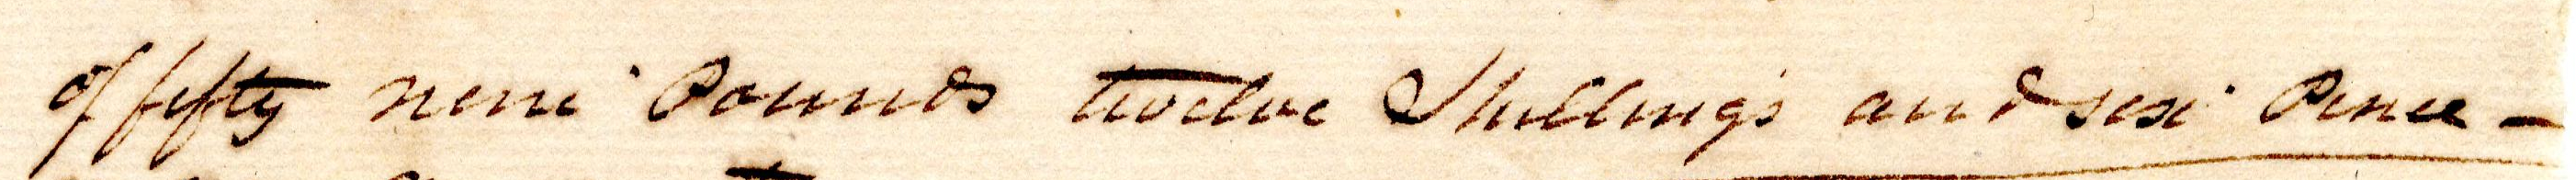of fifty nine Pounds twelve Shillings and six Pence
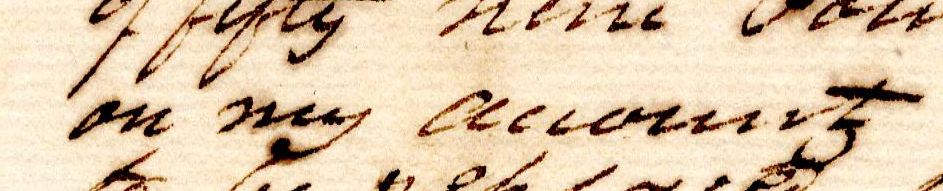on my account
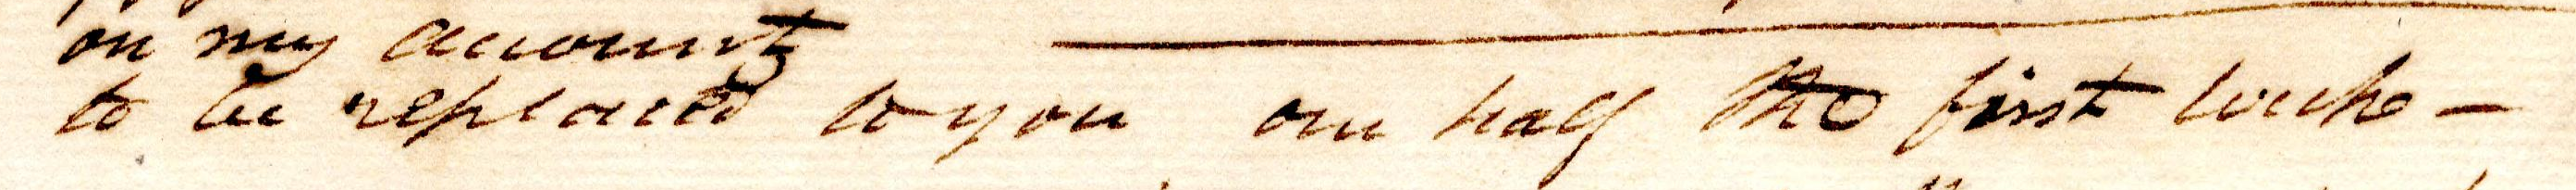to be replaced to you our half the first week-
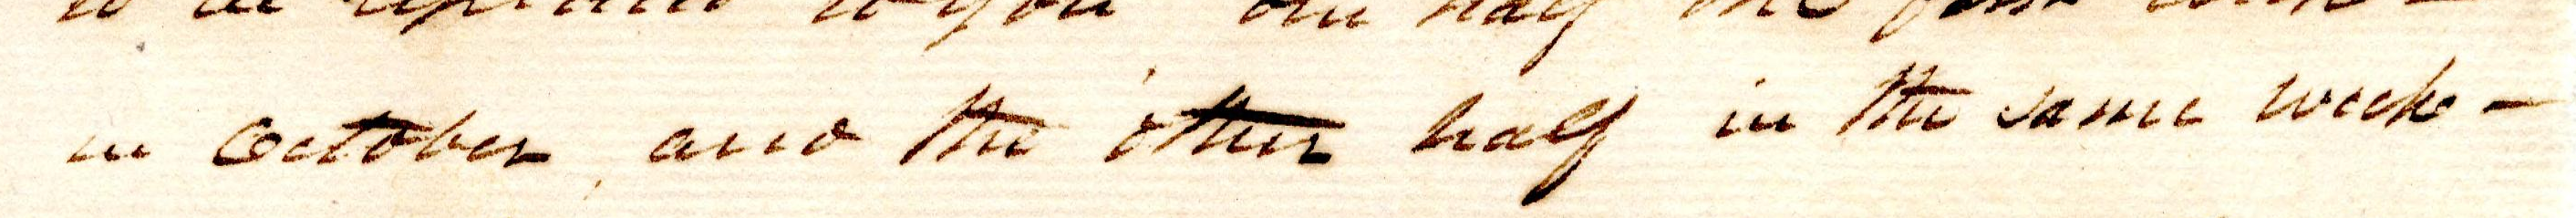in October and the other half in the same week
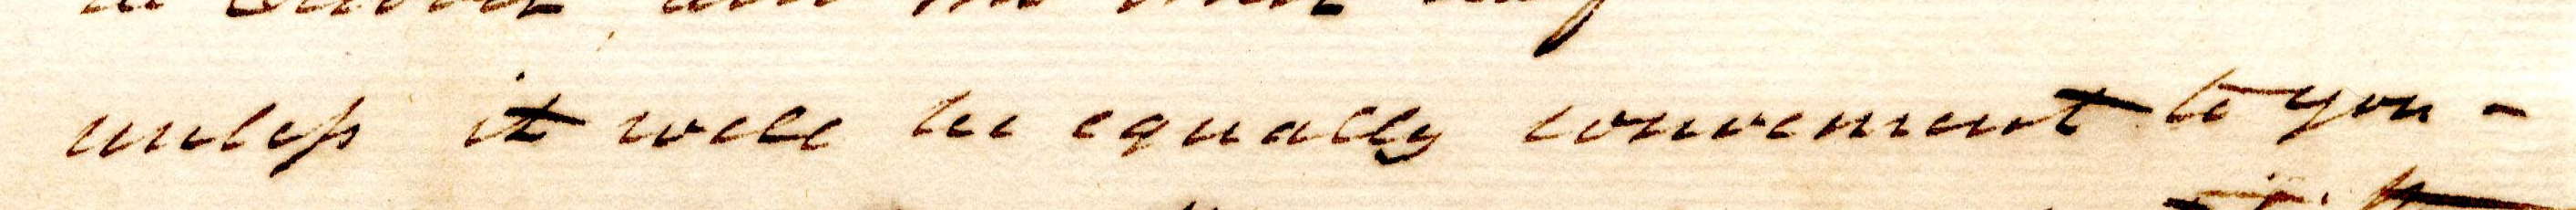unless it will be equally convenient to you
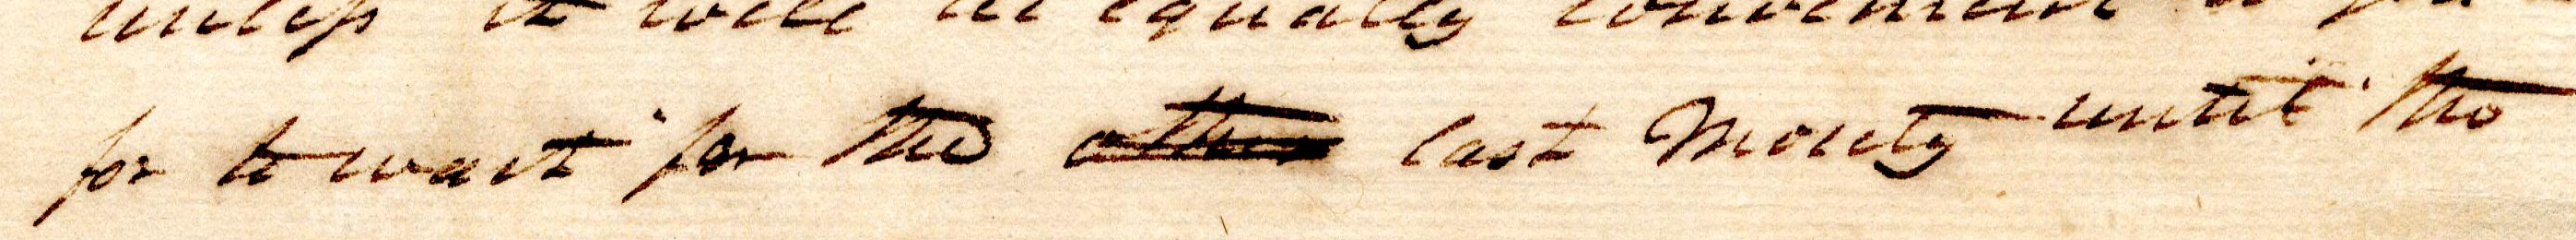for to wait for the other last monety until the
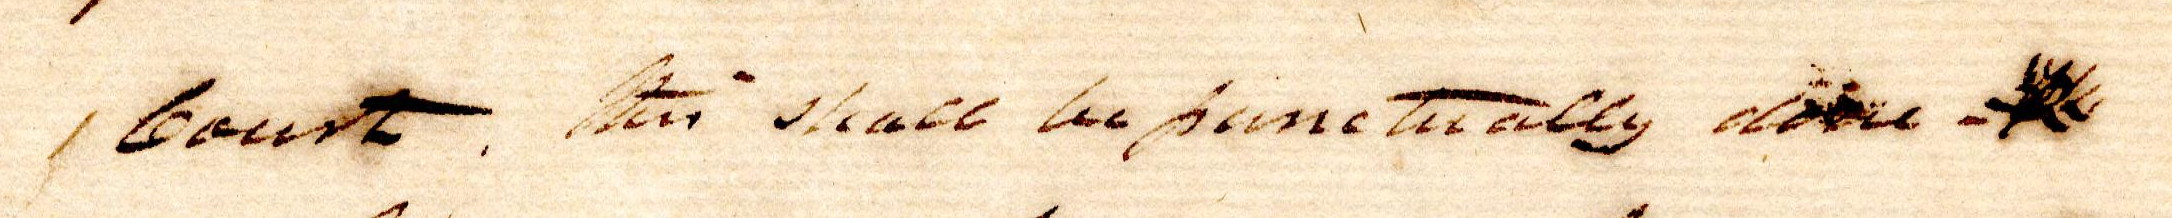Court. this shall be punctually done
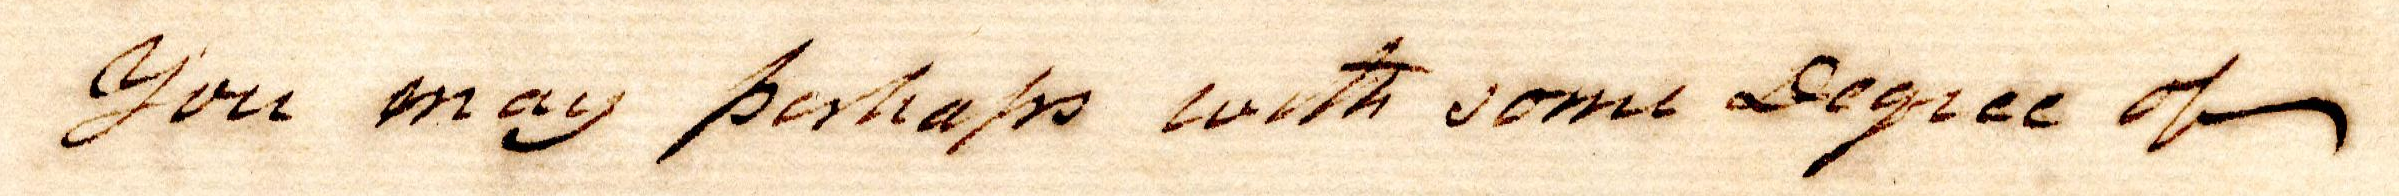You may perhaps with some Degree of
